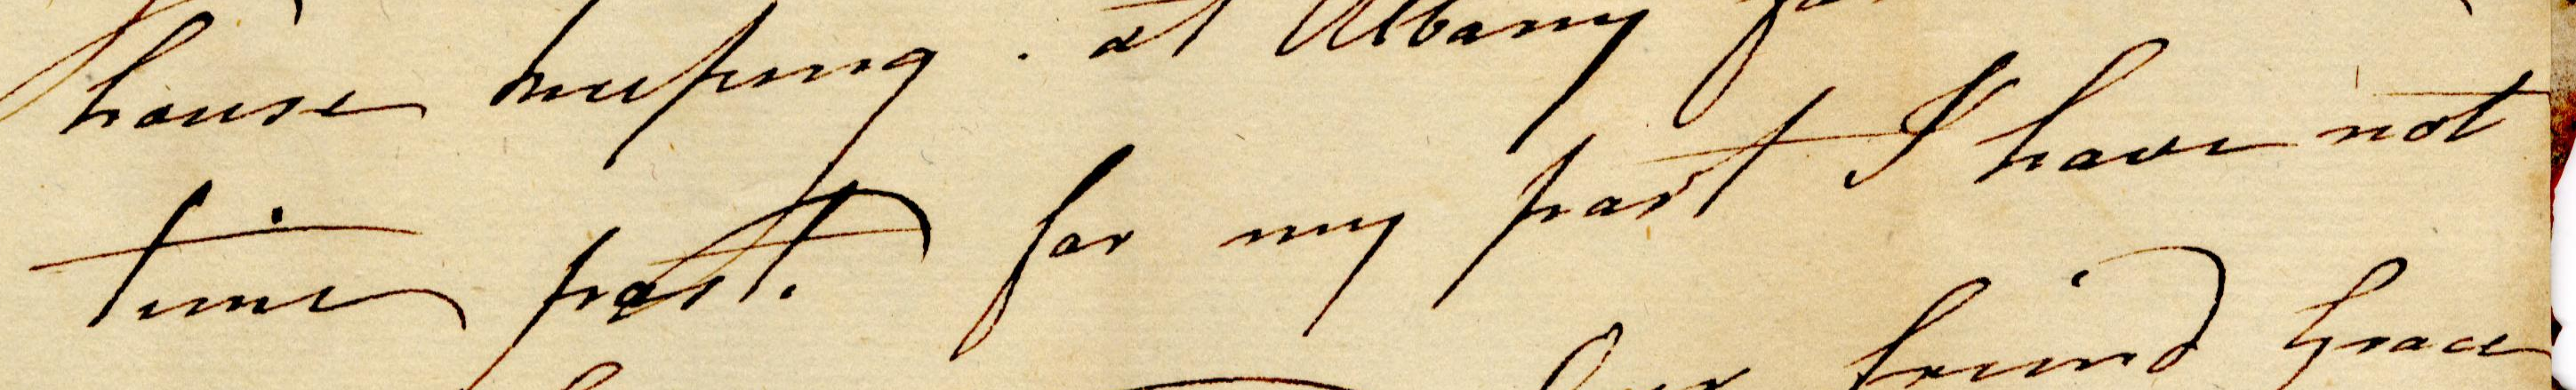time past. for my part I have not
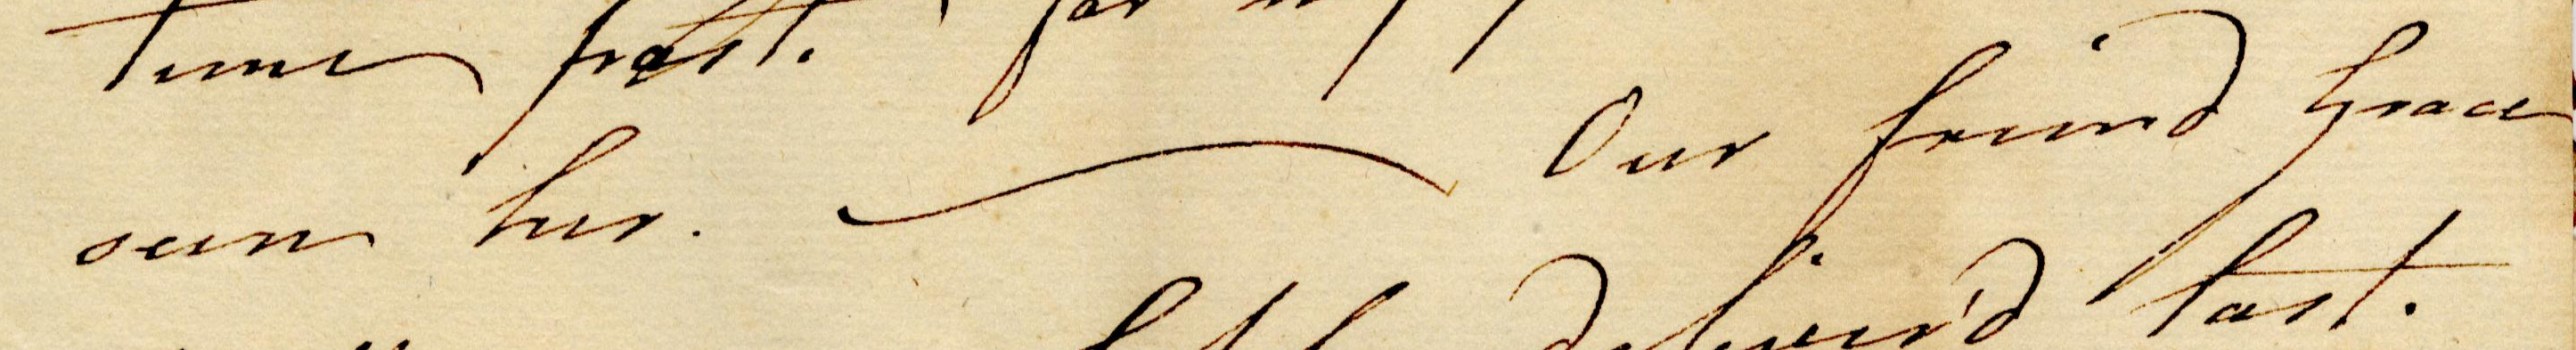seen her.- Our friend Grace
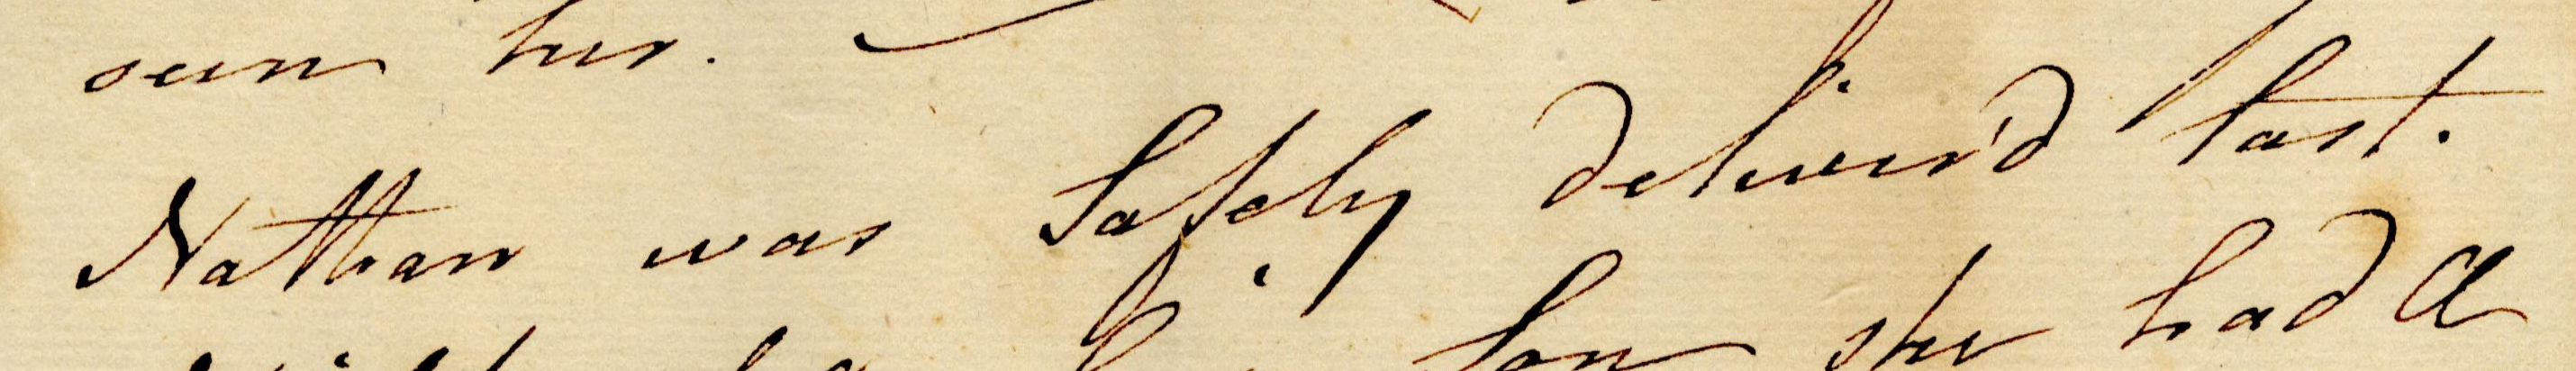Nathan was Safely deliever'd last.
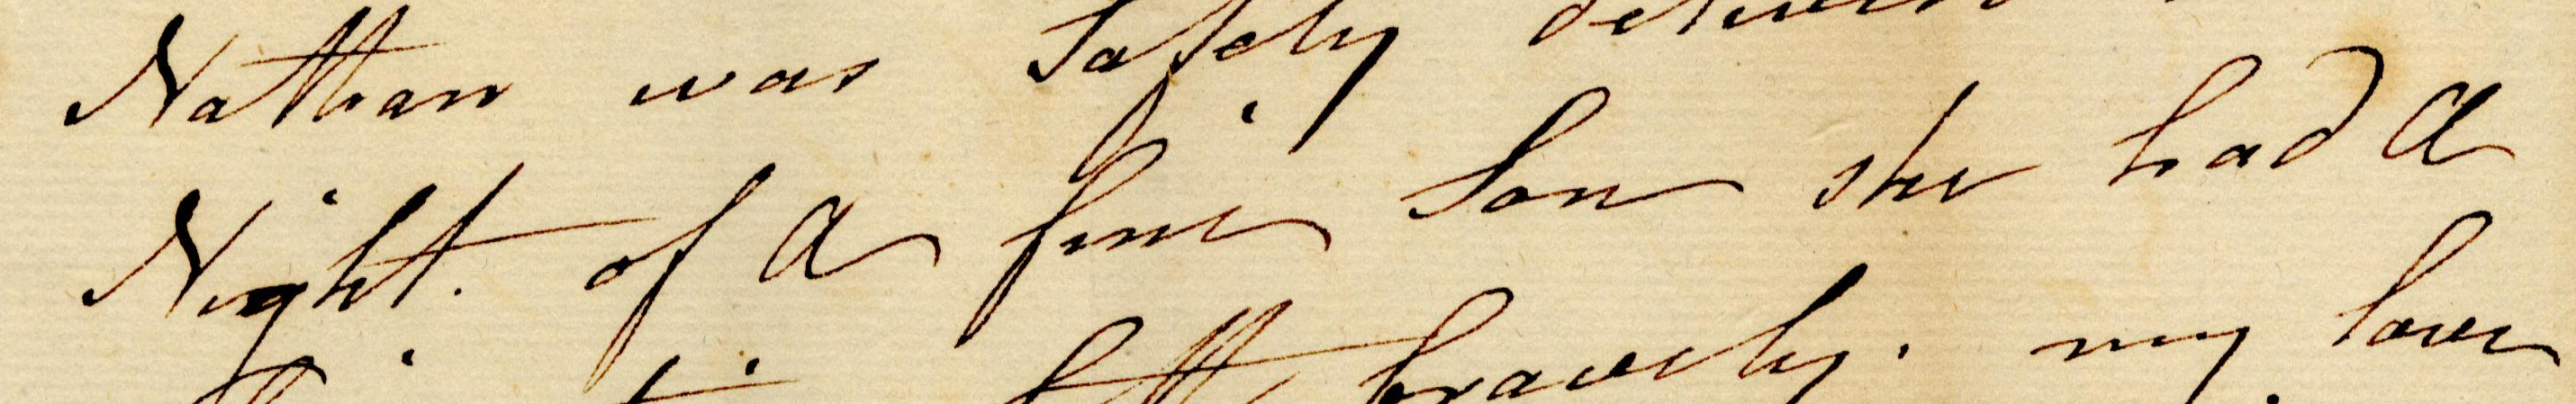Night of A fine Son she had a
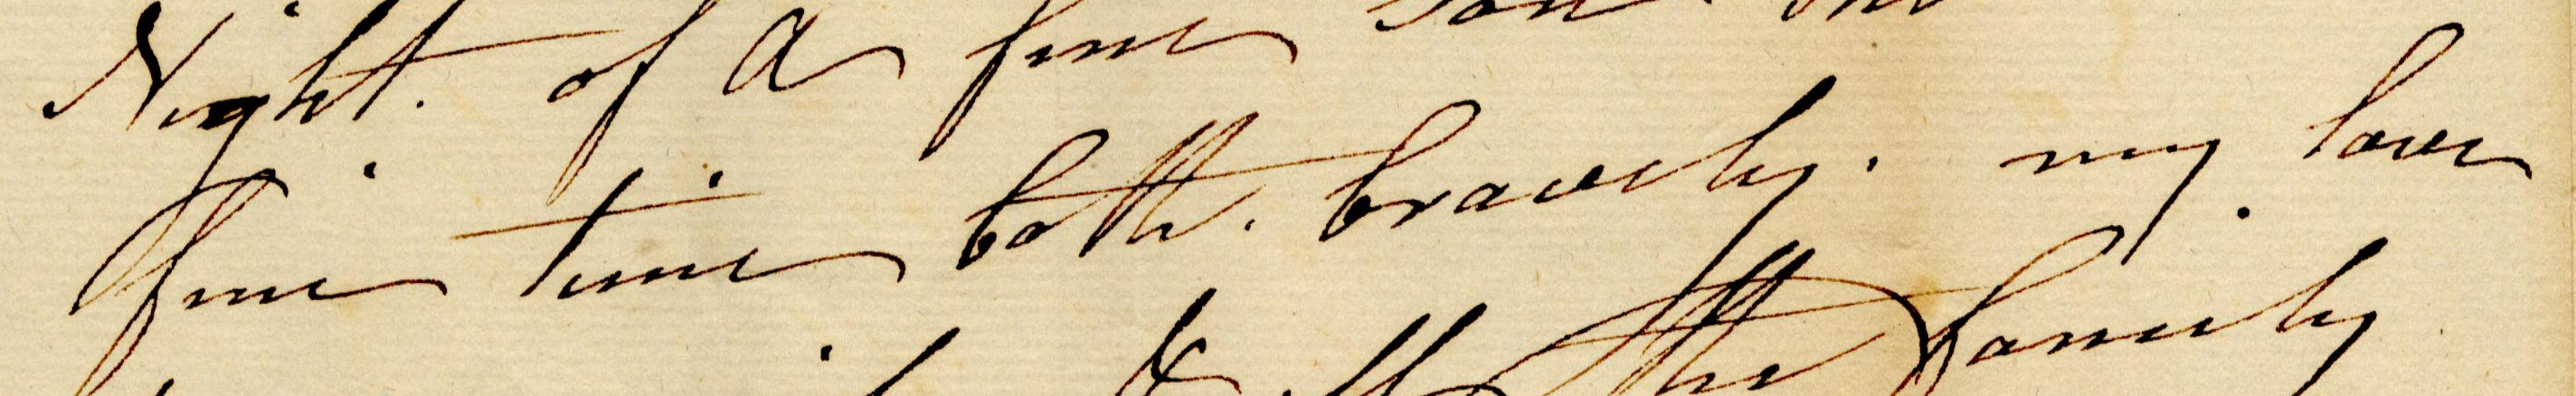fine Time both bravely. my love
